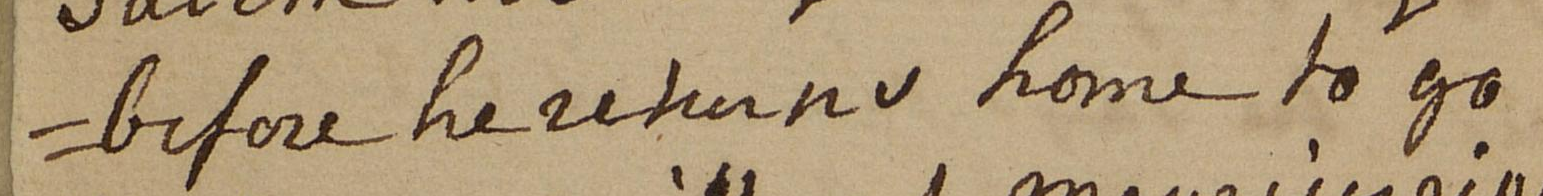-before he returns home to go
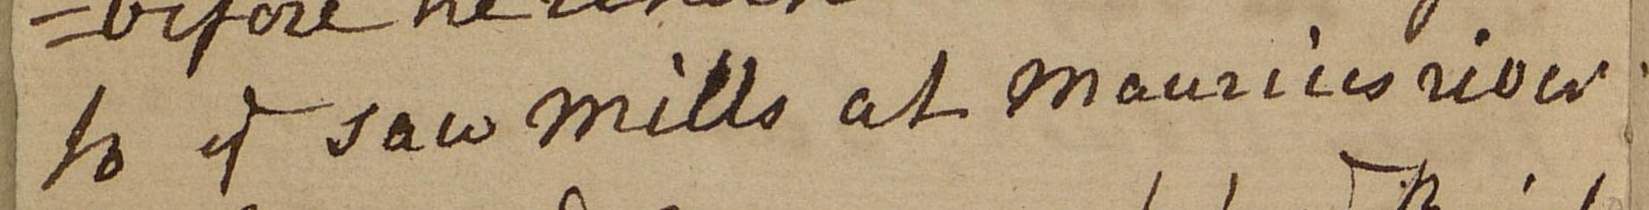to y^e saw Mills at Maurices river
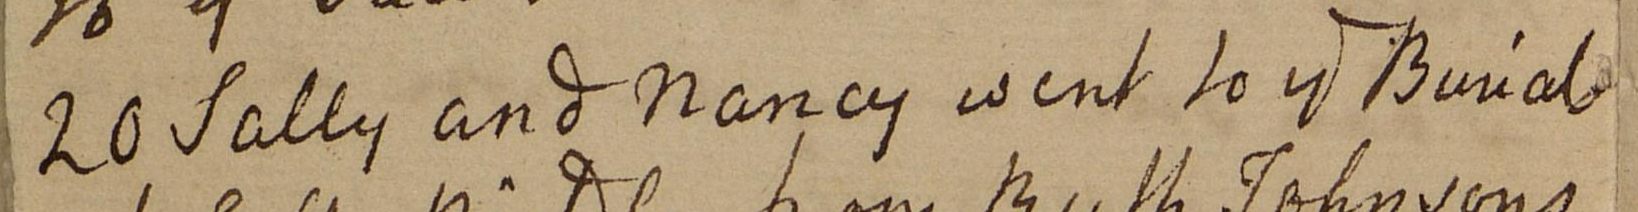20 Sally and Nancy went to y^e Burial
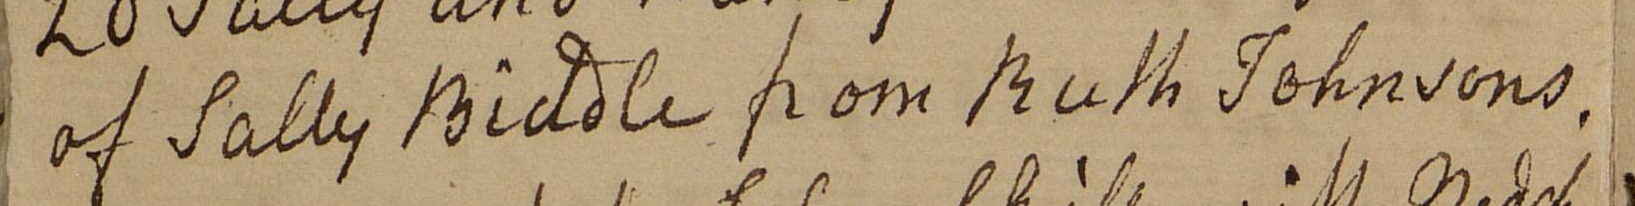of Sally Biddle from Ruth Johnsons,
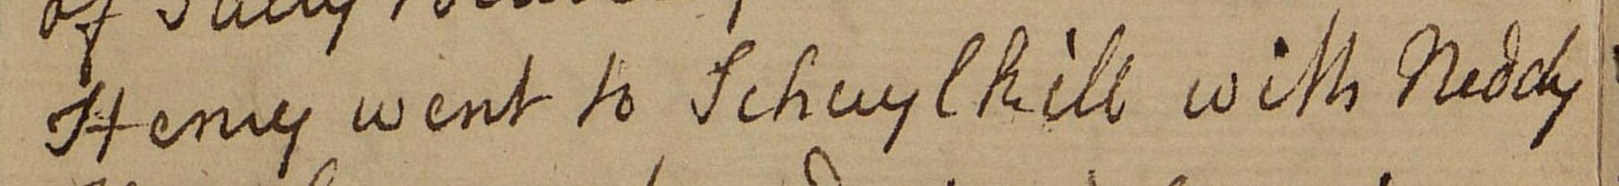Henry went to Schuylkill with Neddy
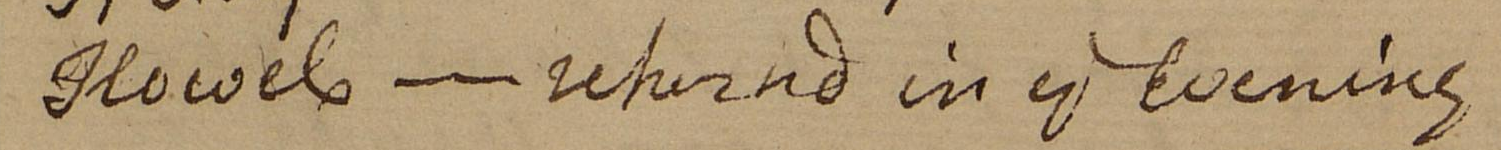Howel- returnd in y^e Evening
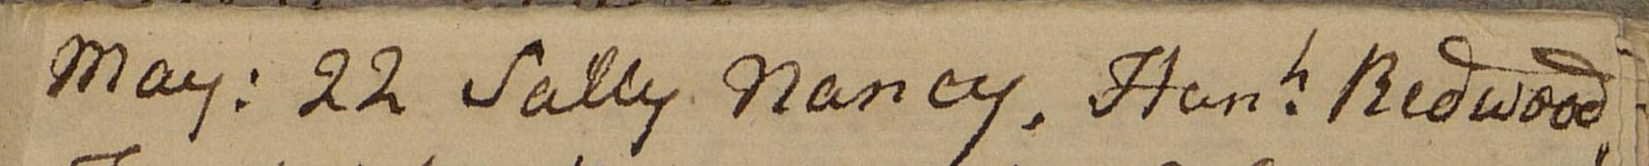May: 22 Sally Nancy, Han^h. Redwood,
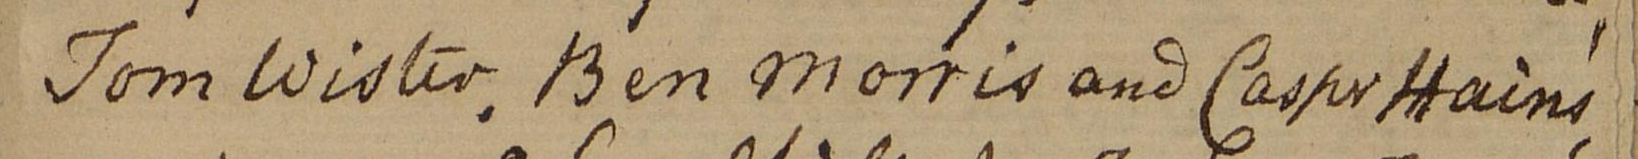Tom Wister, Ben Morris and Caspr Hains,
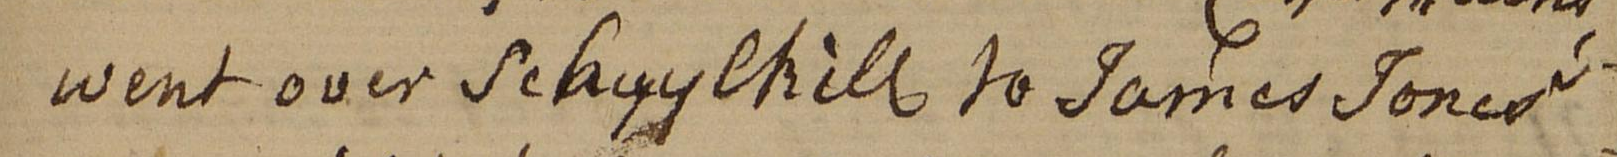went over Schuylkill to James Jones^s
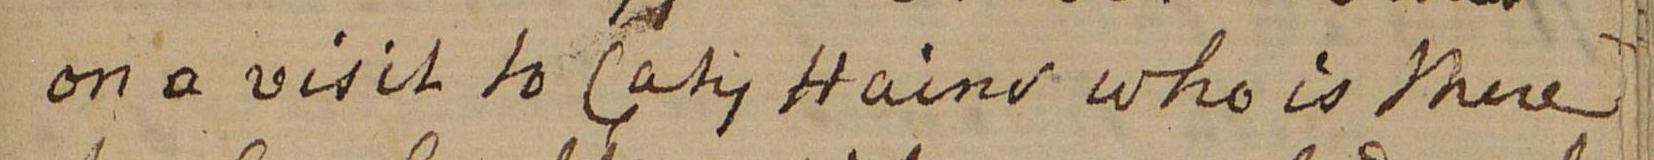on a visit to Caty Hains who is there
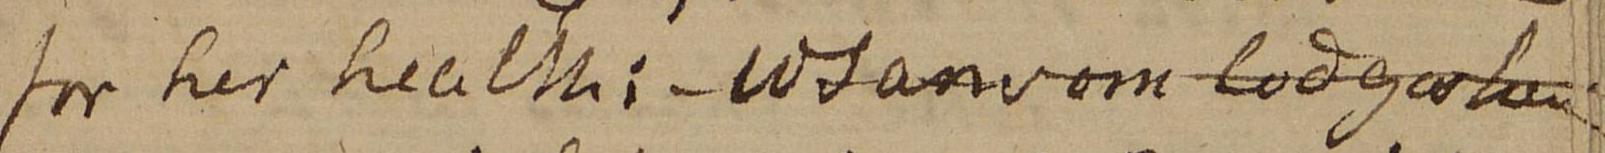for her health;- W Sansom lodges her
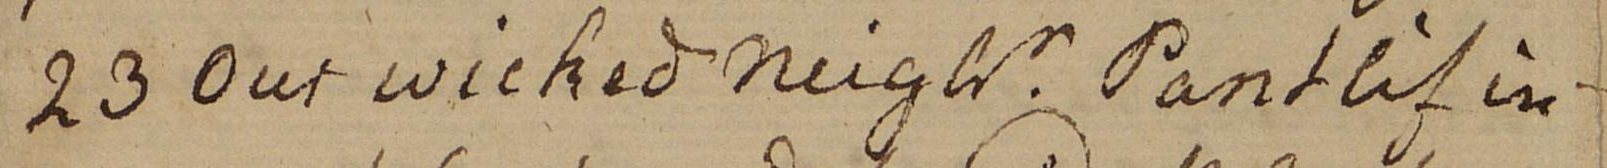23 our wicked Neigh^r. Pantlif in
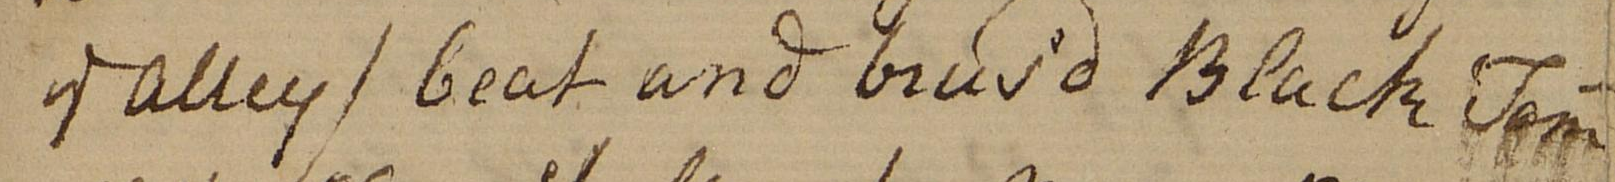y^e Alley/ beat and brus'd Black Tom-
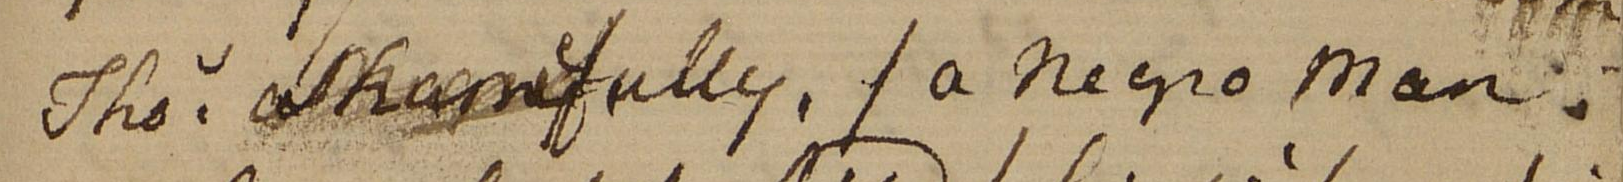Tho.^s Shamefully, / a Negro man.
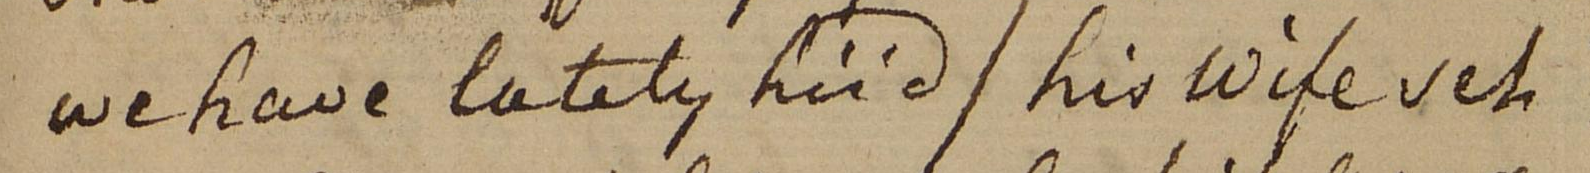we have lately hir'd/ his wife set
